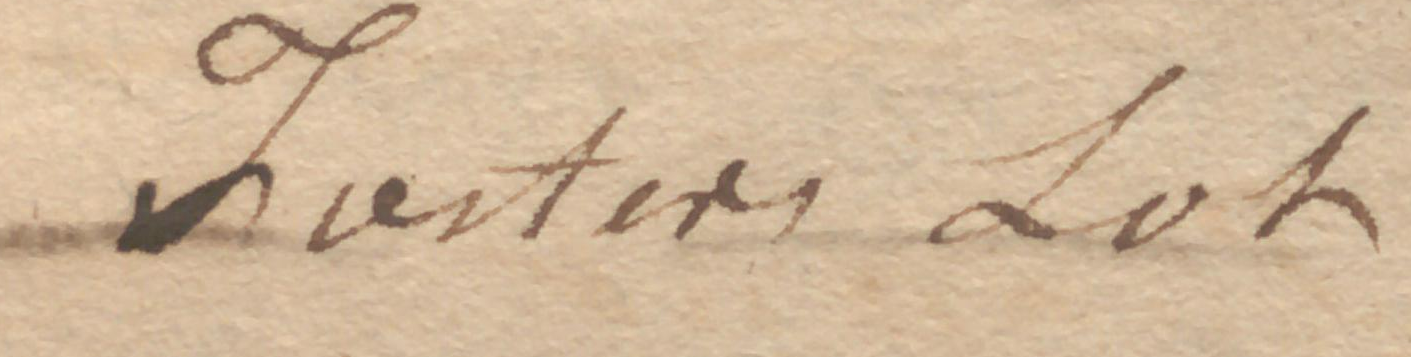Fosters Lot
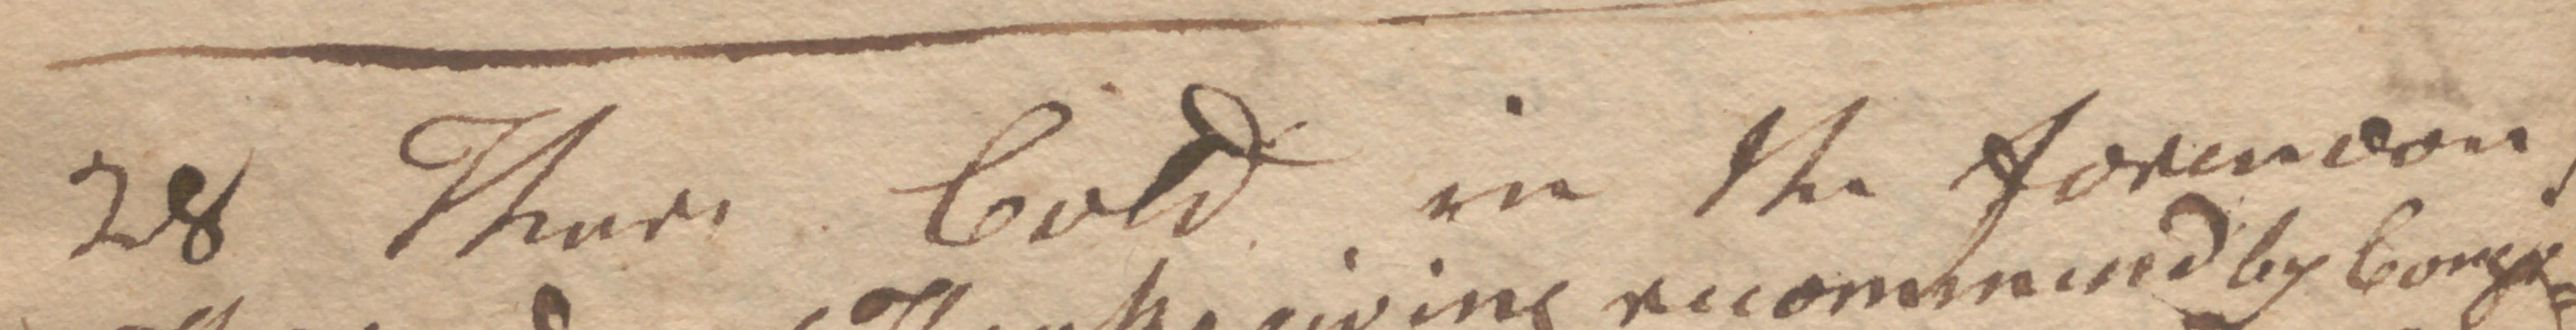28 Thurs Cold in the forenoon
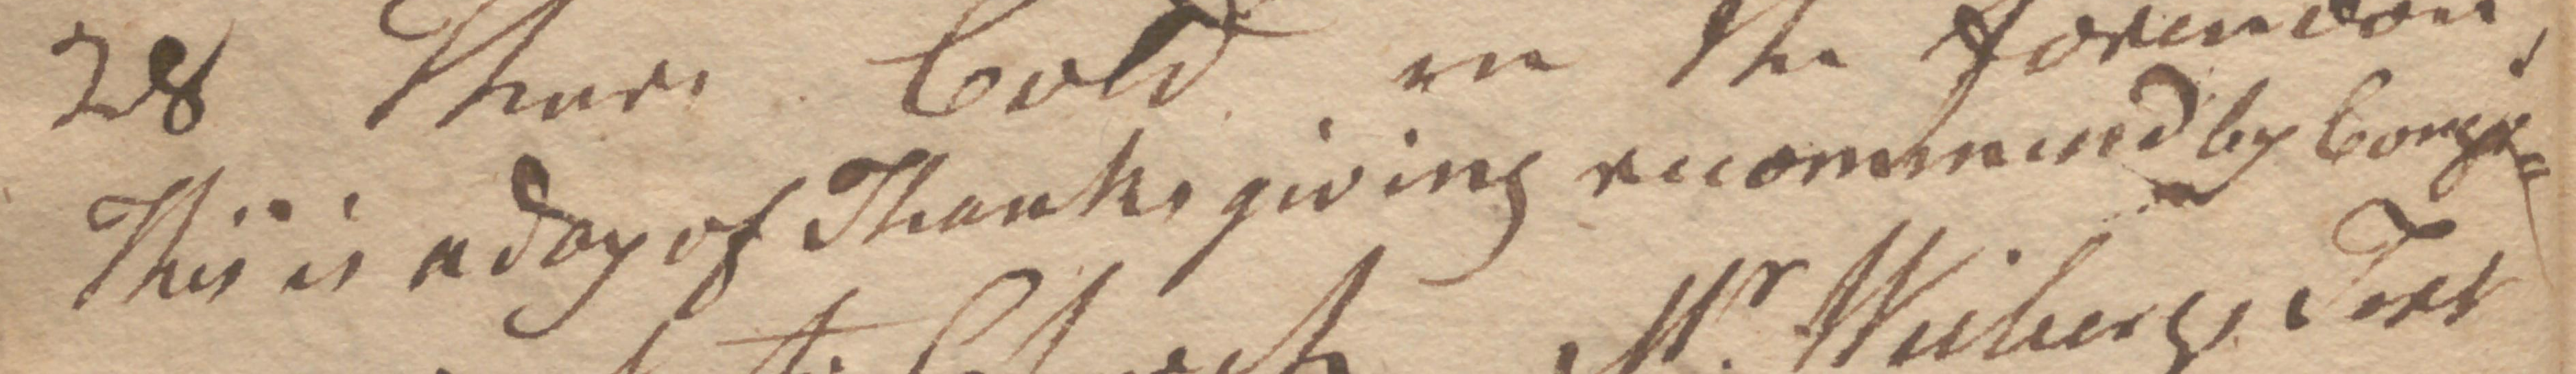This is a day of Thanksgiving recommend by Congress
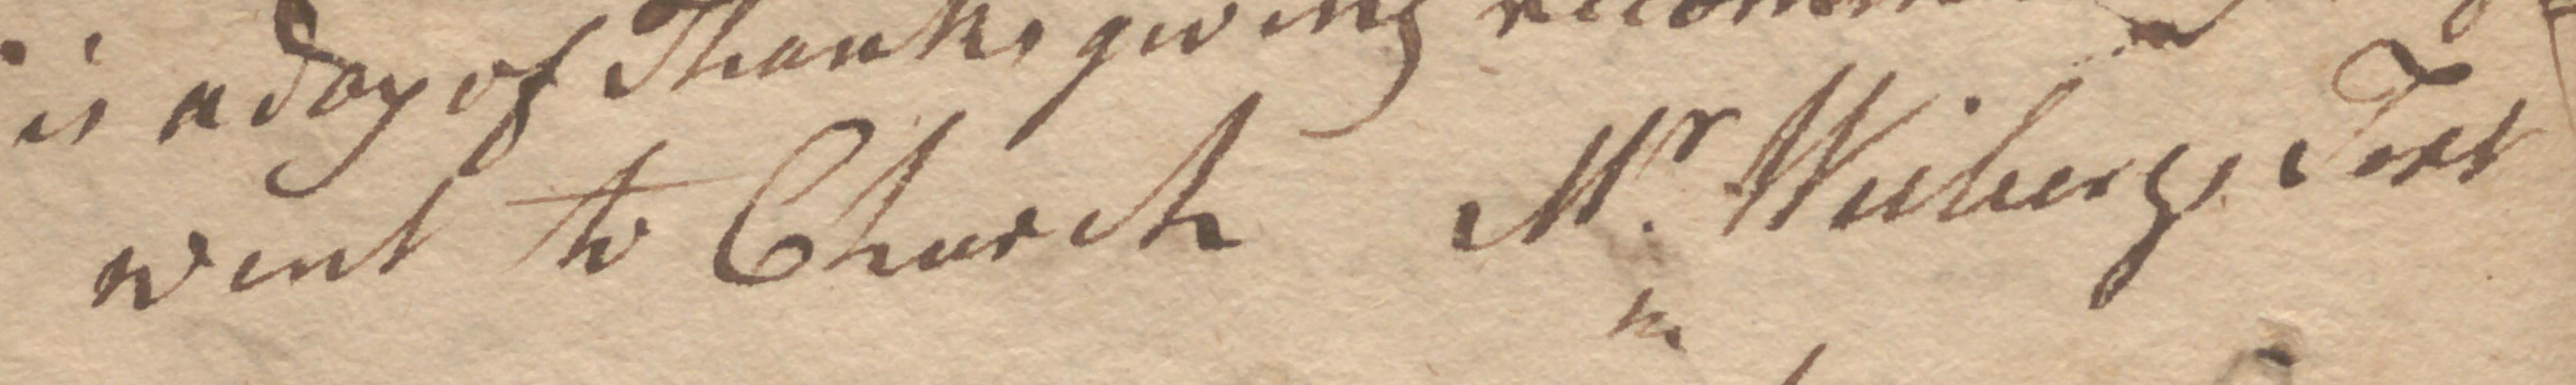went to Church M^r. Weibergs Text
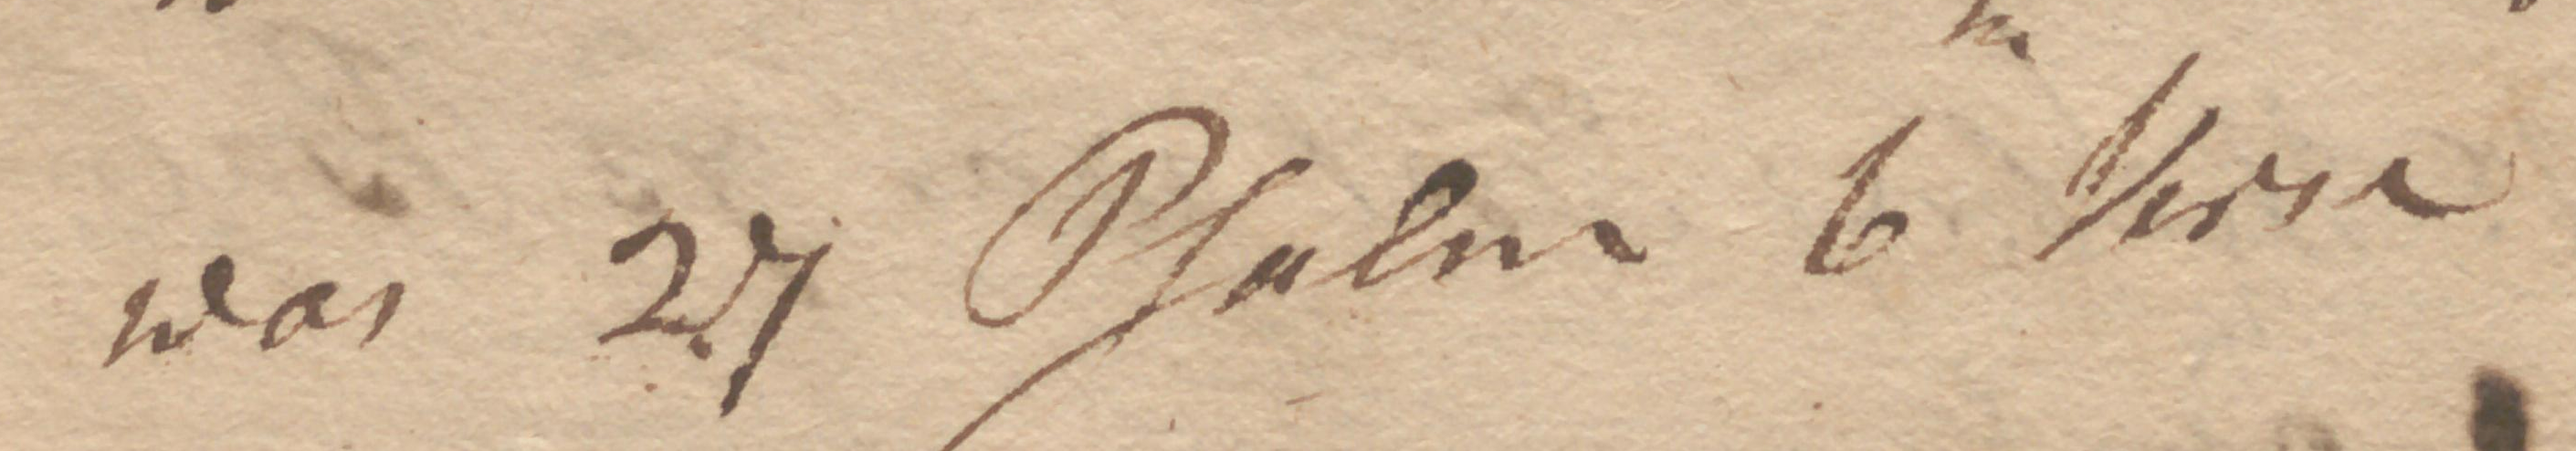was 27 Psalm 6^th Verse
